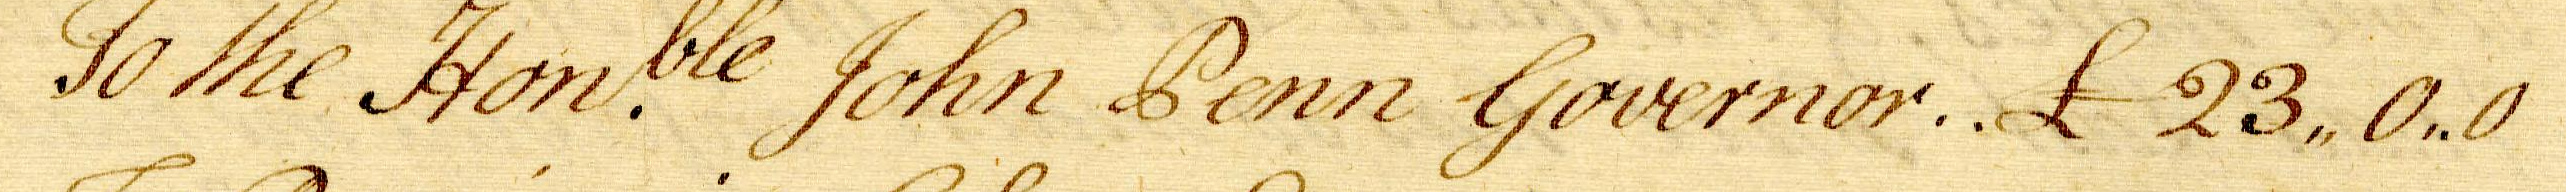To the Hon.^ble John Penn Governor.. £23..0..0
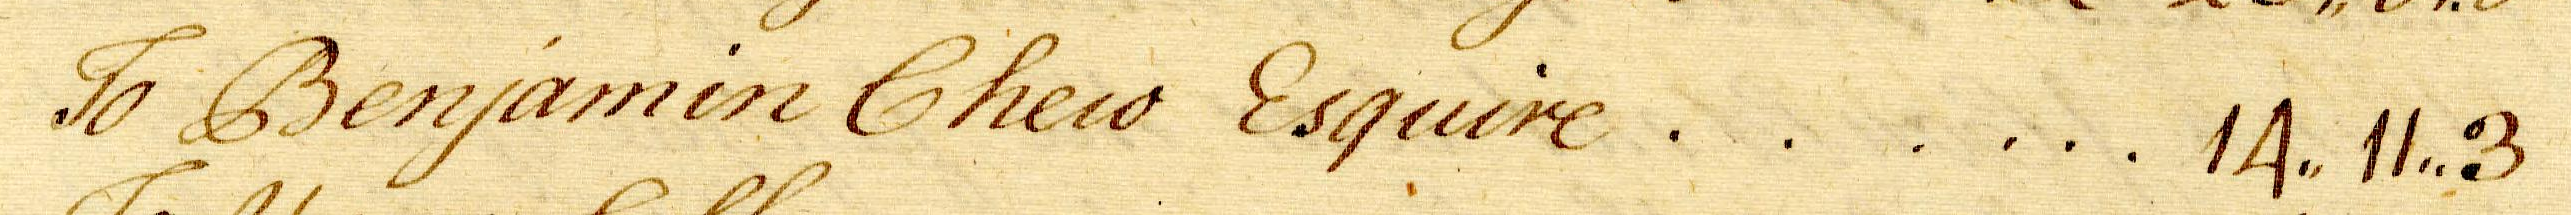To Benjamin Chew Esquire...... 14..11..3
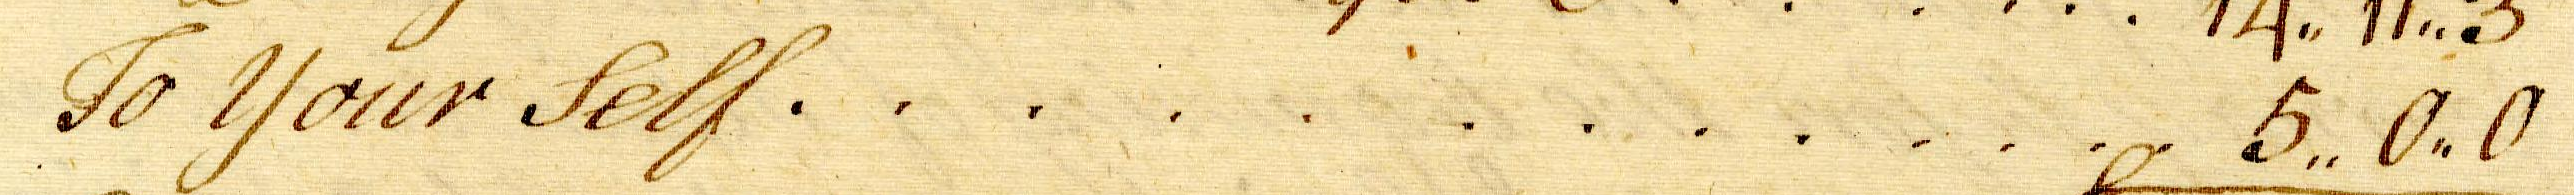To Your Self.............5..0..0
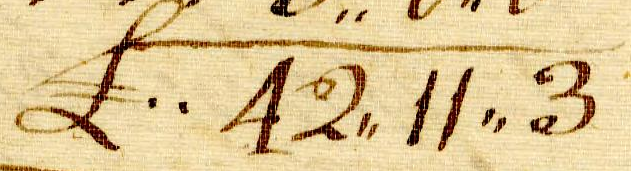£42..11..3
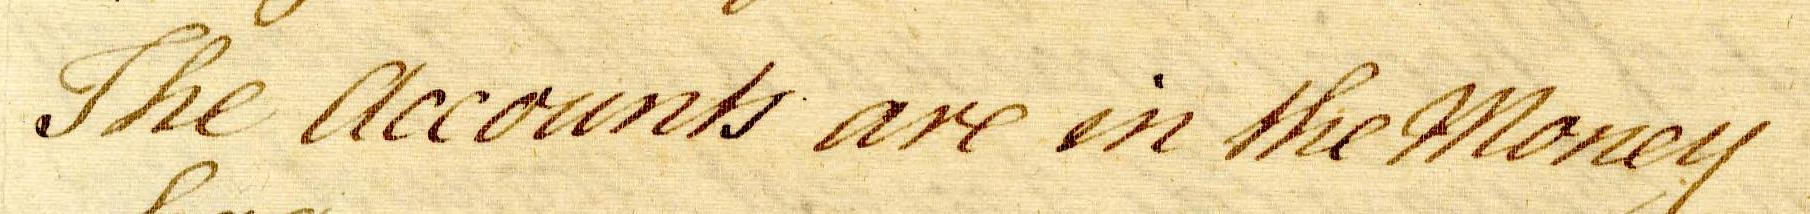The Accounts are in the Money
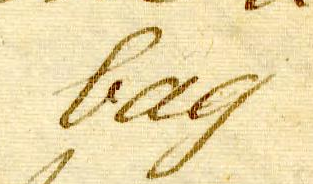bag
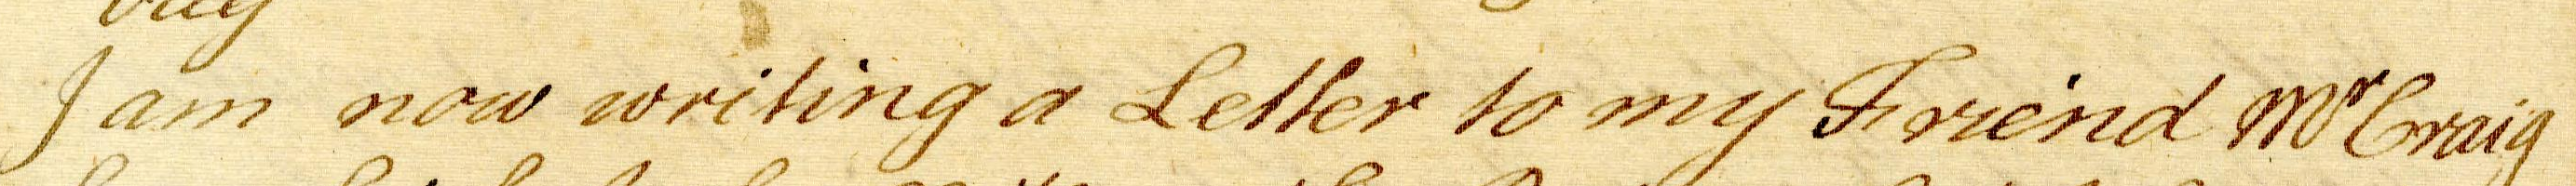I am now writing a Letter to my Friend M^r Craig
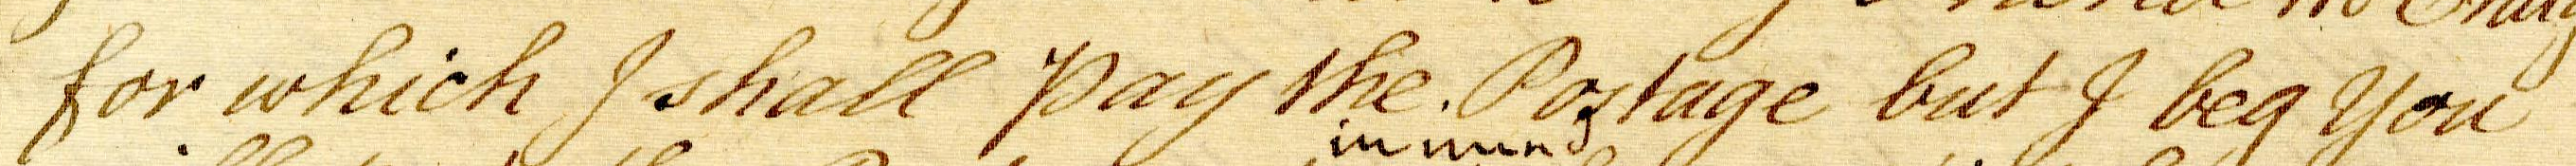for which I shall Pay the Portage but I beg You
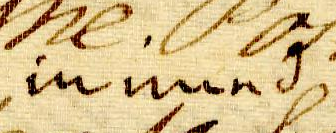in mind
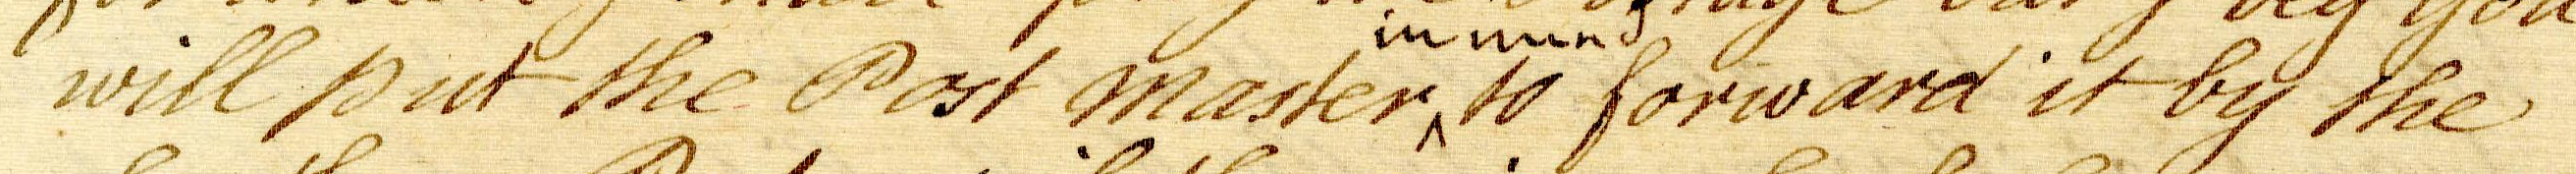will put the Post master ^ to forward it by the
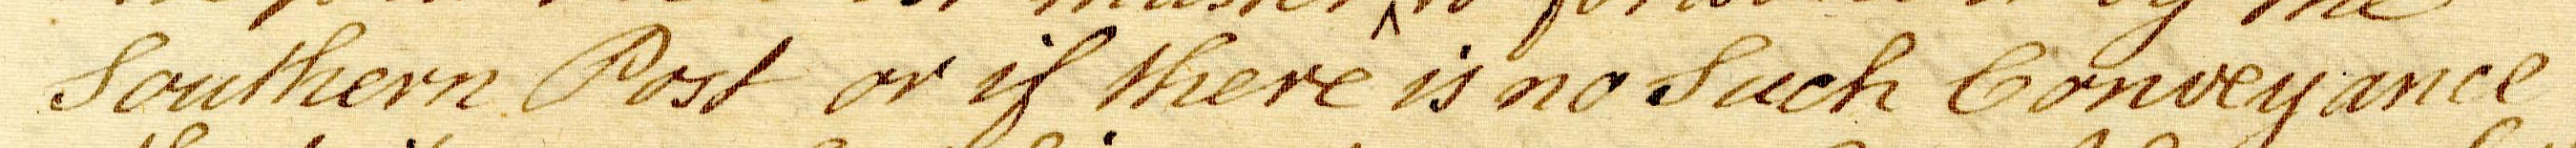Southern Post or if there is no Such Conveyance
